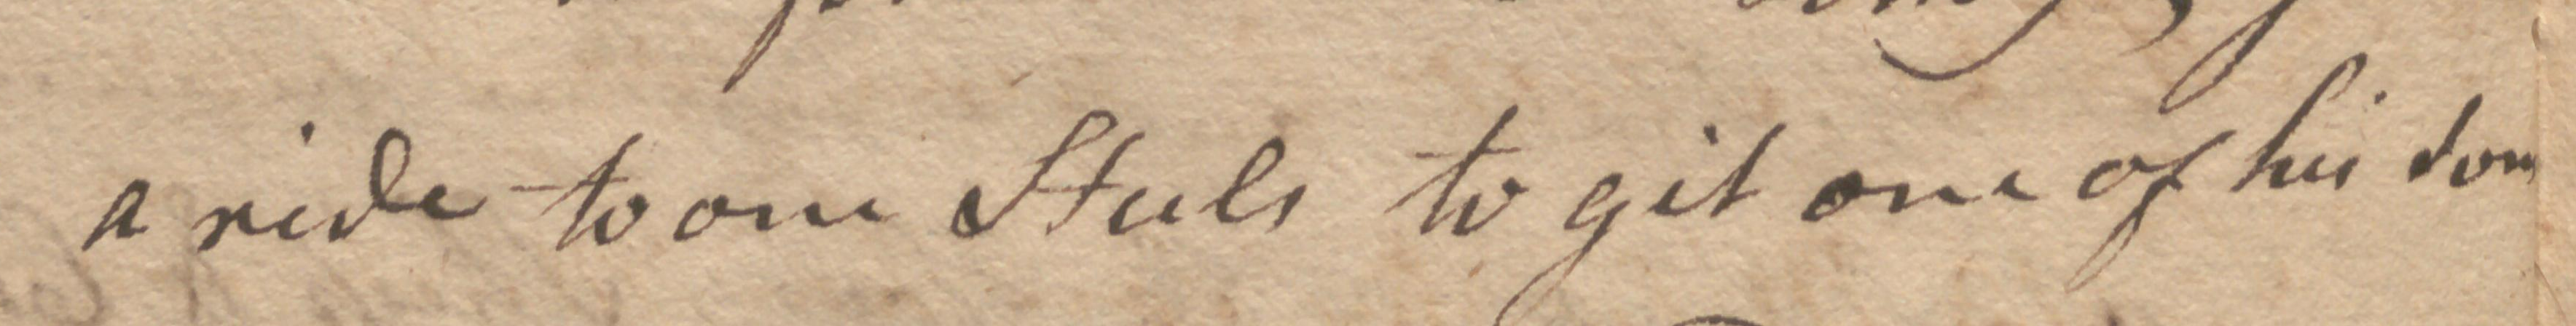a ride to one Steels to git one of his son
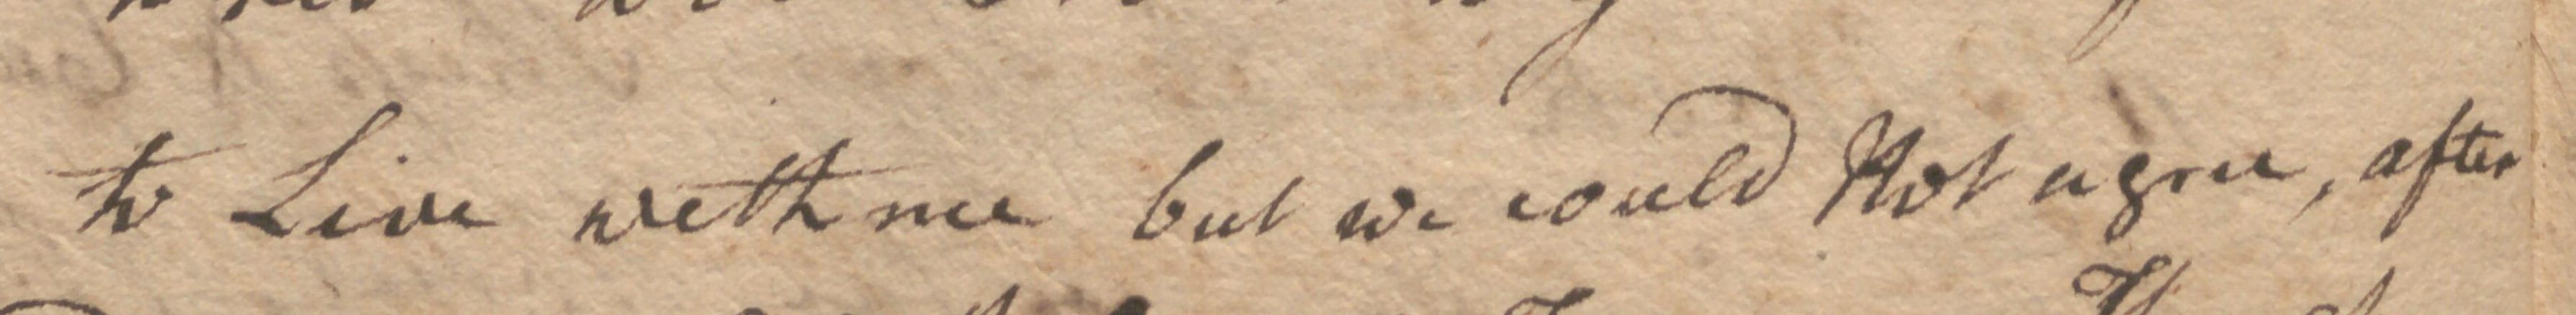to Live with me but we could Not agree, after
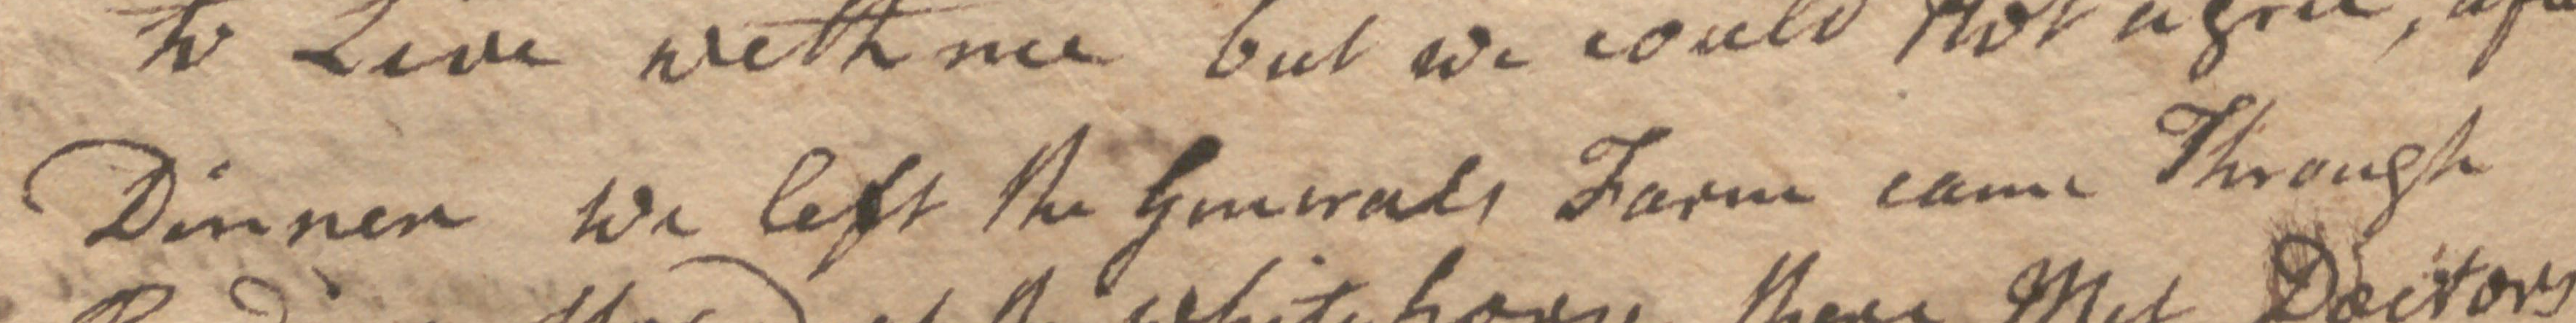Dinner we left the Generals Farm came Through
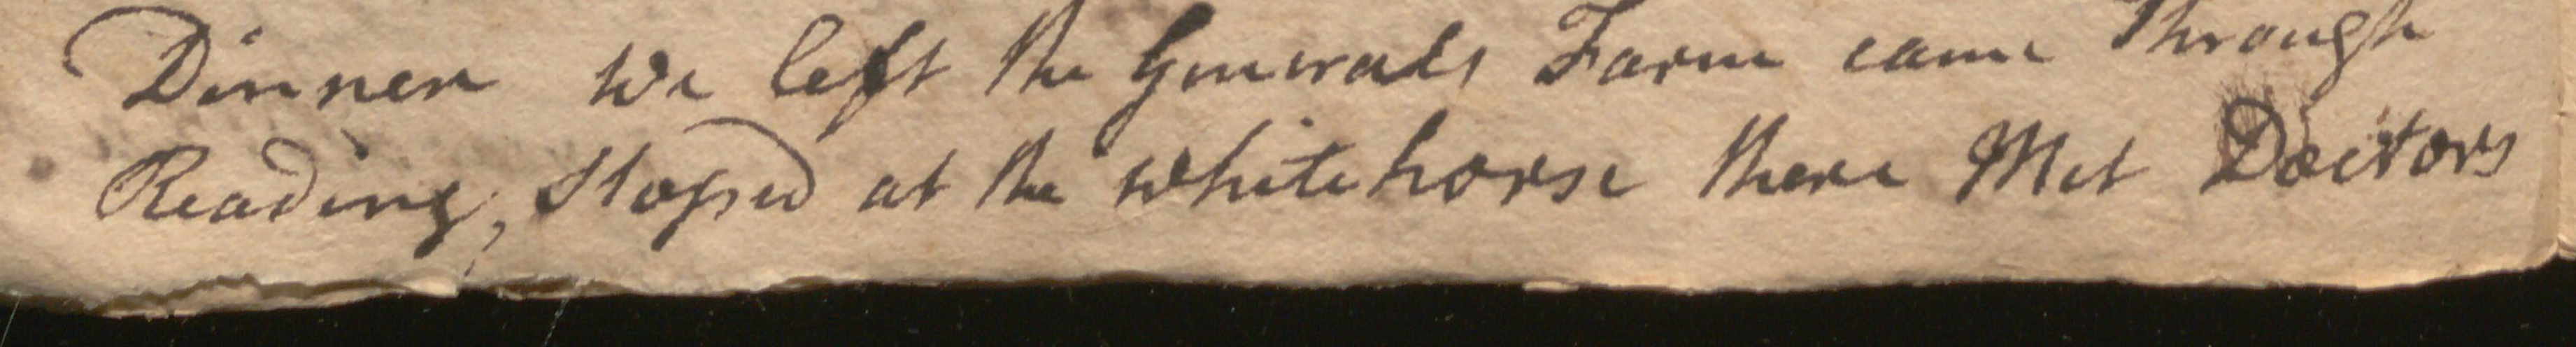Reading, Stoped at the whitchorse there Met Doctors
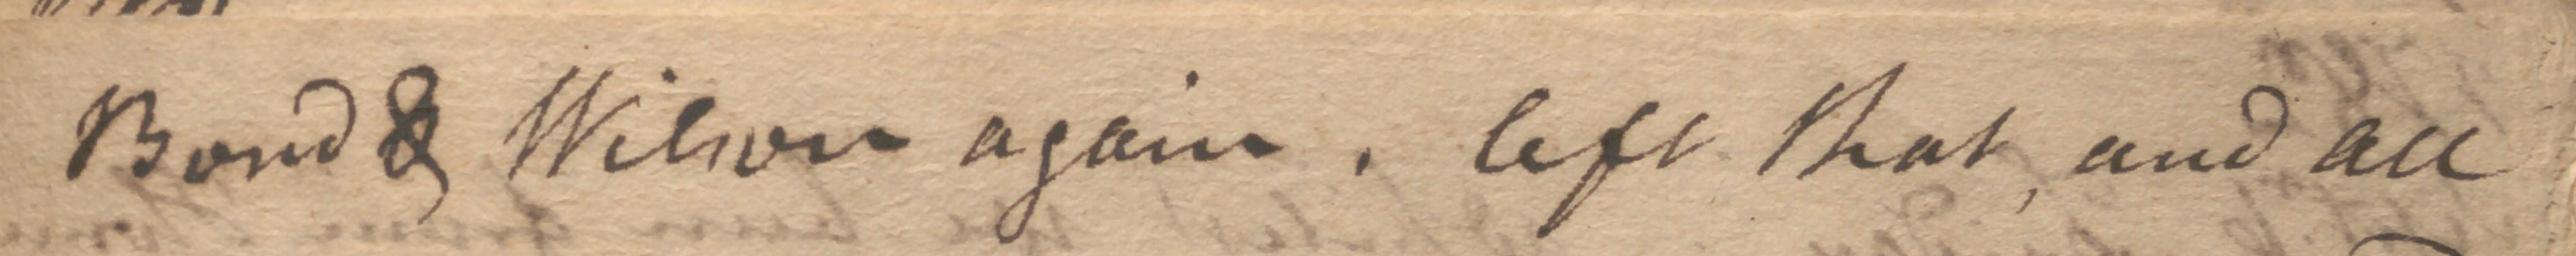Bond & Wilson again. left that and all
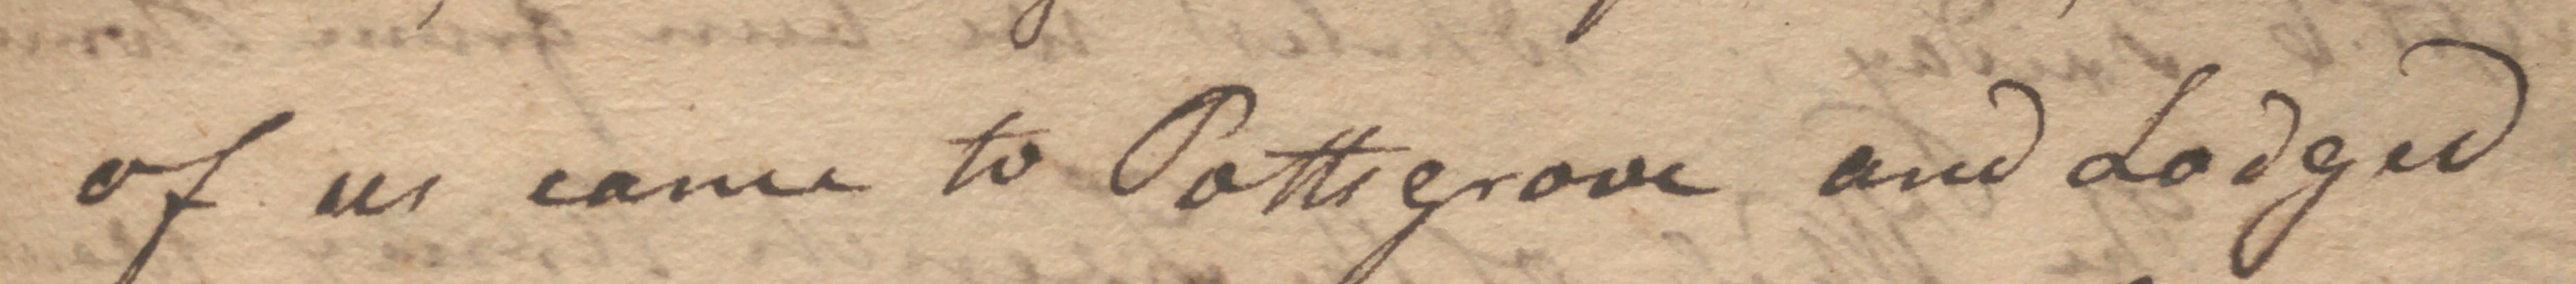of us came to Pottsgrove and Lodged
